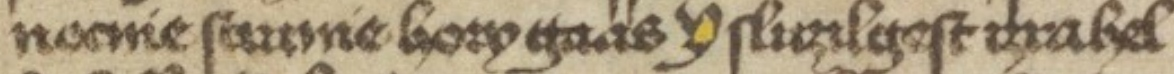nocnie ſtranie hory gaas Y ſluzilgeſt izrahel
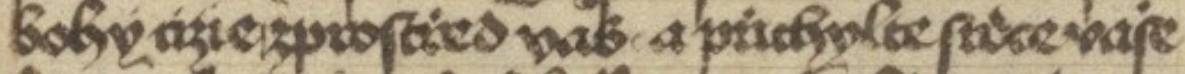bohy cizie zproſtṙed vas a pṙichylte ſrdce vaẛe
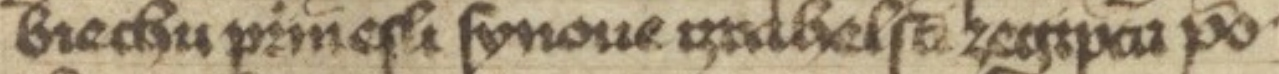biechu pṙineſli ſynoue izrahelſti Zegipcu po.
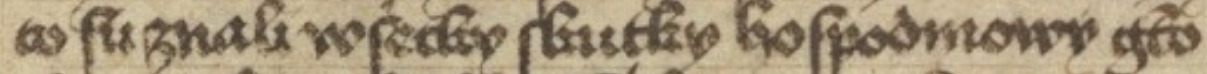to ſu znali wẛecky ſkutky hoſpodinowy g̑to
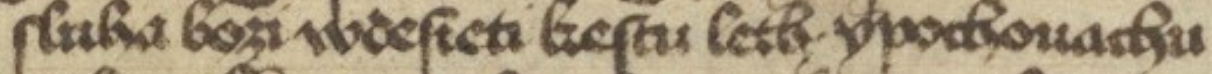ſluha bozi wdeſieti keſtu leth.ypochouachu
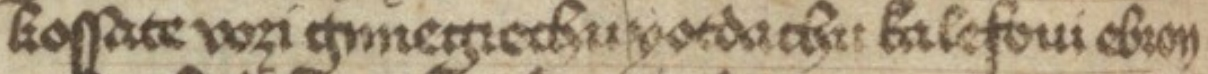koſſate vozi gmiegiechu yotdachi kalefoui ebron
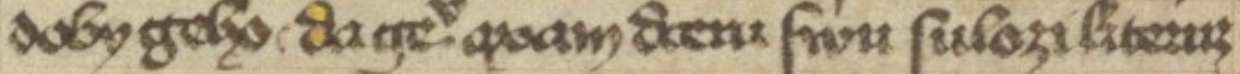doby geho Da ge.v axam dceru ſwu ſulozi kteruz
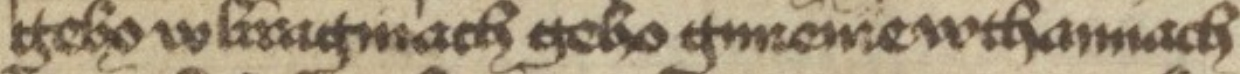geho w kraginiach geho gmienie wthamiach
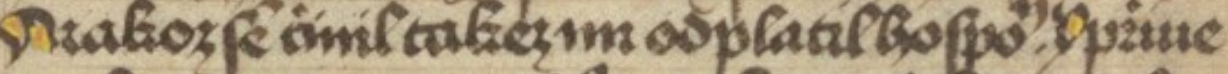Aiakoz ſȇ ċinil takez mi odplatil hoſpo.n Ypṙiue
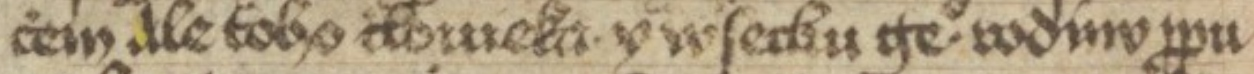ċem Ale toho ċlouieka.y wſecku ge.° rodinv ꝓpu-
